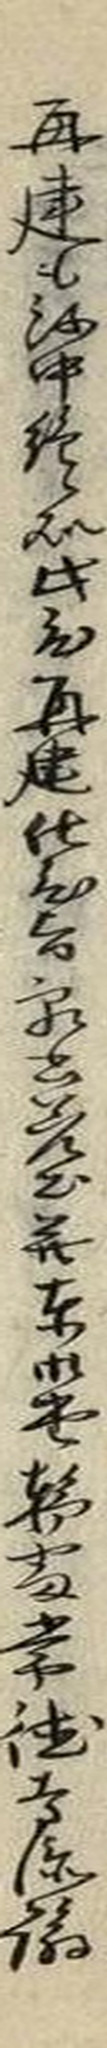再建も致中絶候処此度再建仕度旨願書差出幷東御堂輪番常徳寺添翰
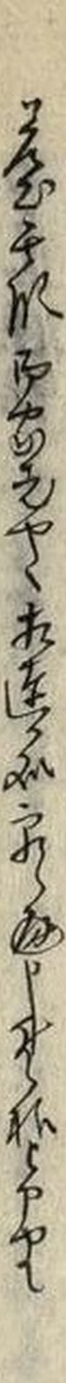差出其段御家老中へ相達候処願之通申付候様被申聞候
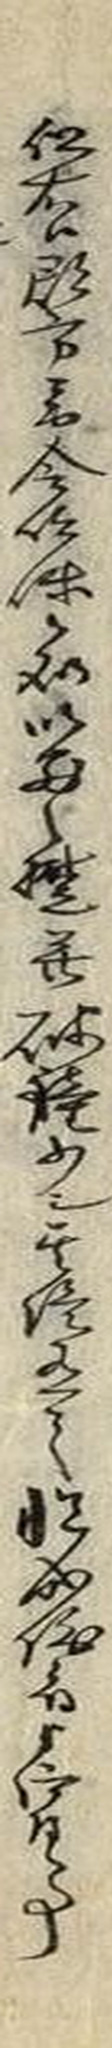但右ハ郡方ニ而令吟味候処以前之礎幷破鐘少シ其儘有之慥成儀ニ付被仰付候事
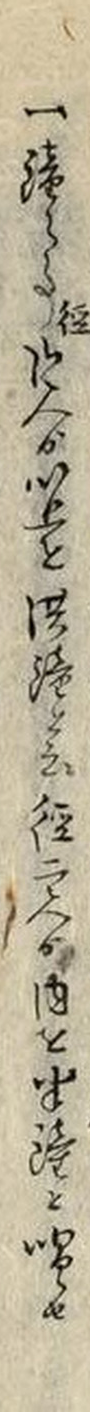一鐘之事径弐尺ゟ以上を洪鐘と言径二尺ゟ内を半鐘と唱候由
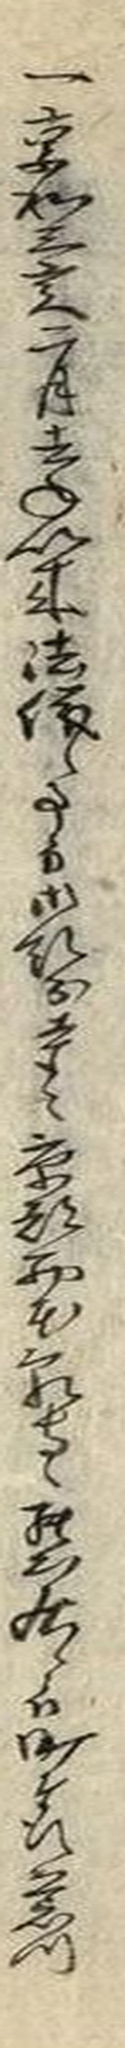一享和三亥二月去年以来法儀之事ニ付御領分寺々京都西本願寺へ罷出居候ニ付町奉行荒川
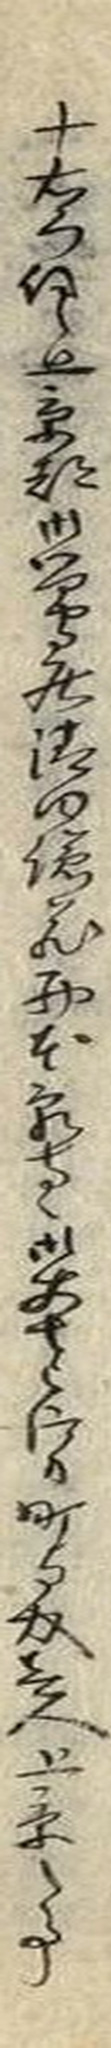十右衛門伺之上京都御留守居清田謙蔵西本願寺へ御使者被仰付町与力壱人
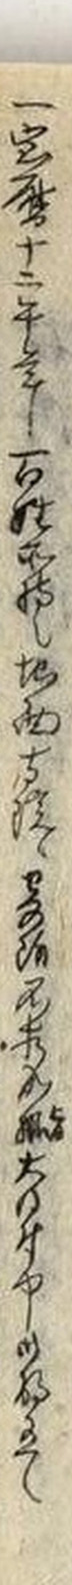一宝暦十二午年百姓所持之地面寺院へ寄附不相成旨大目付中御触有之
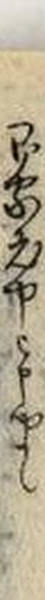御家老中被申聞候
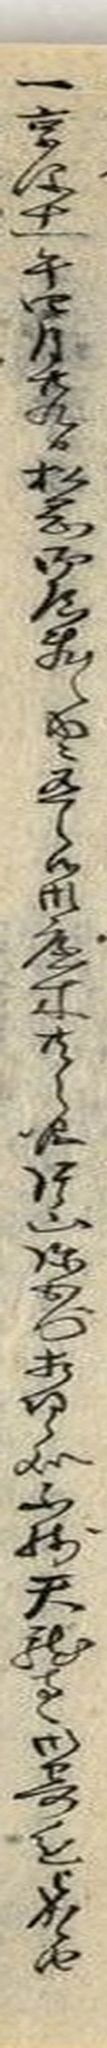一享保十一午四月廿九日松岡御屋敷之内ニ有之候御庭木共之儀片山弥五右衛門相伺候処不残天龍寺へ御寄進被成候由

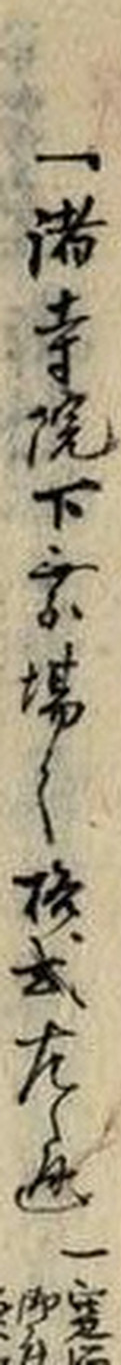一諸寺院下乗場之格式左之通
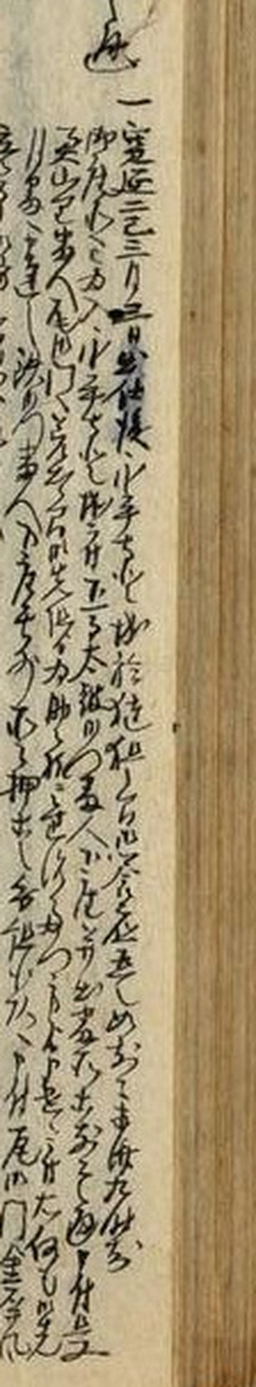一寛延二巳三月三日出仕後永平寺登城於韃靼之間御饗応有之如前々相済九時前
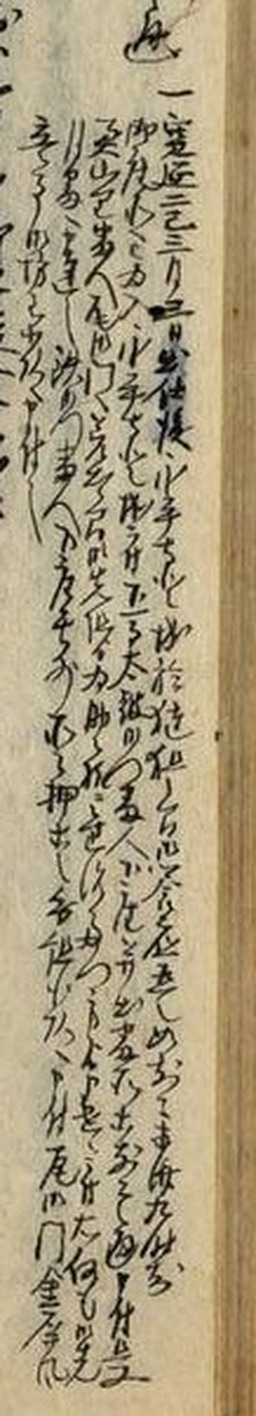御座所へ被為入候永平寺登城ニ付下馬太鼓御門番人下座幷出番所等前々之通申付且又
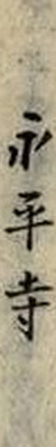永平寺
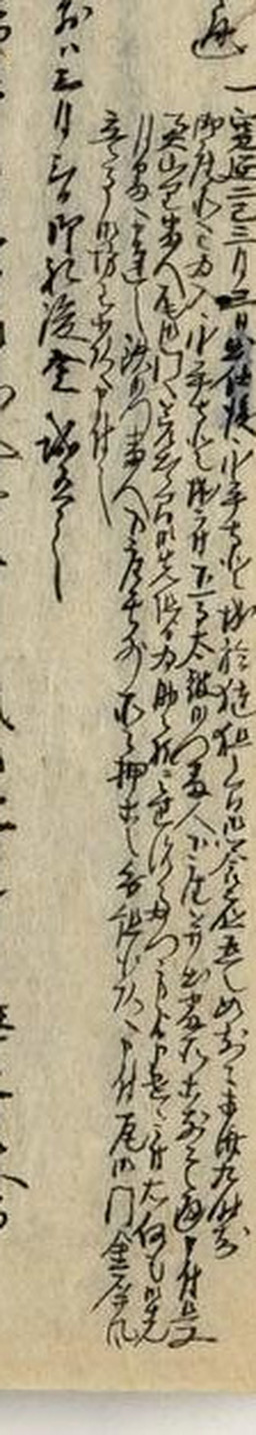月番へ申達之鉄御門番人下座其外所々押等之分組小頭へ申付瓦御門金屛風
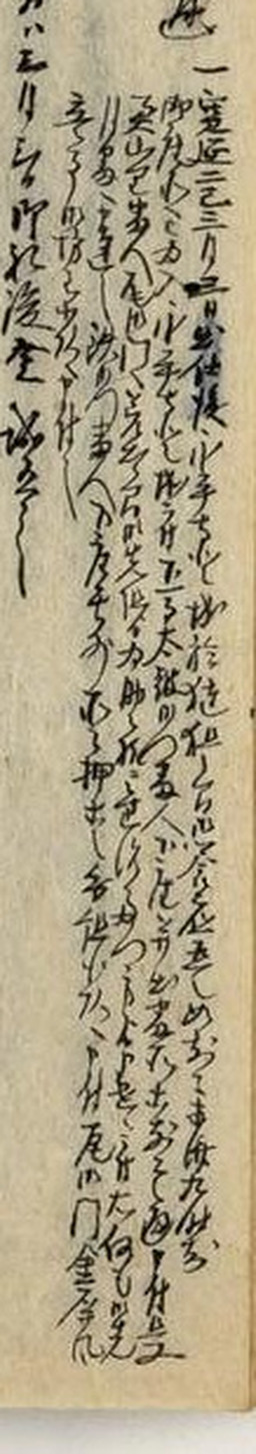奥山里番人瓦御門へ差出候間先組ゟ為助候様ニ笹治多門方ゟ申遣候ニ付右何も御先
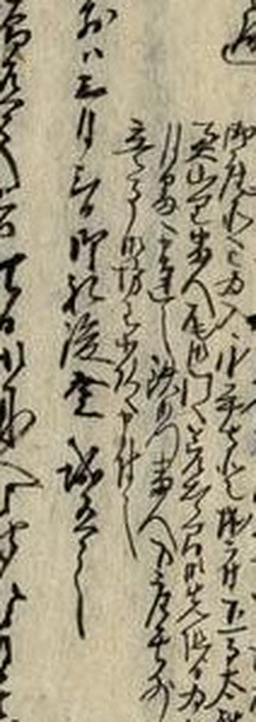立候事御坊主小頭へ申付之
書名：御国他国諸事之部
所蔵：福井県文書館 Fukui Prefectural Archives
